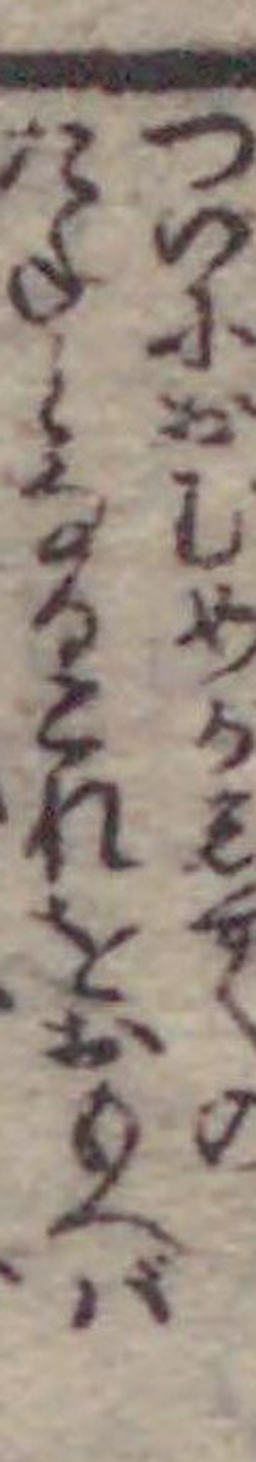たねとなるこれをおもへば
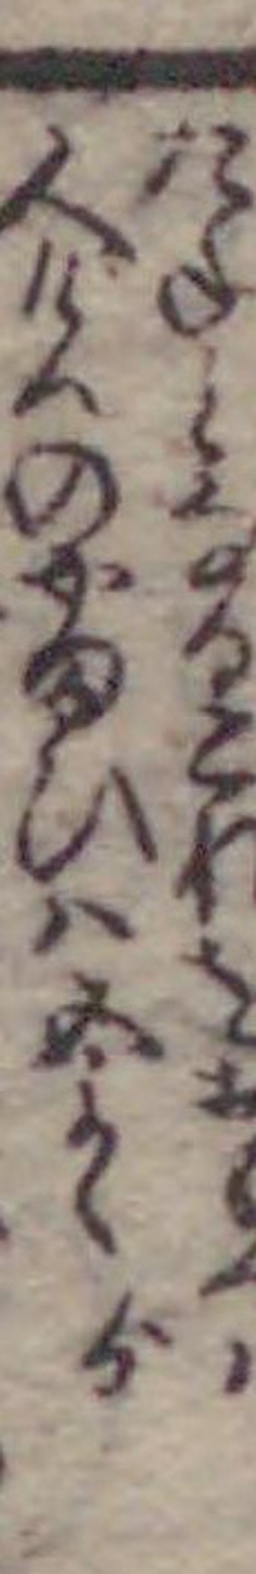人けんのやまひは五よくゟ
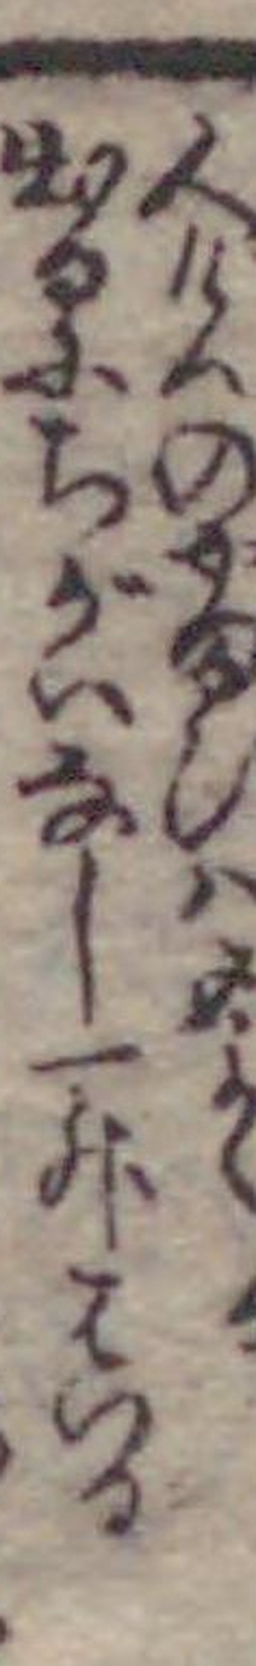出るにちがいなし一升はいる
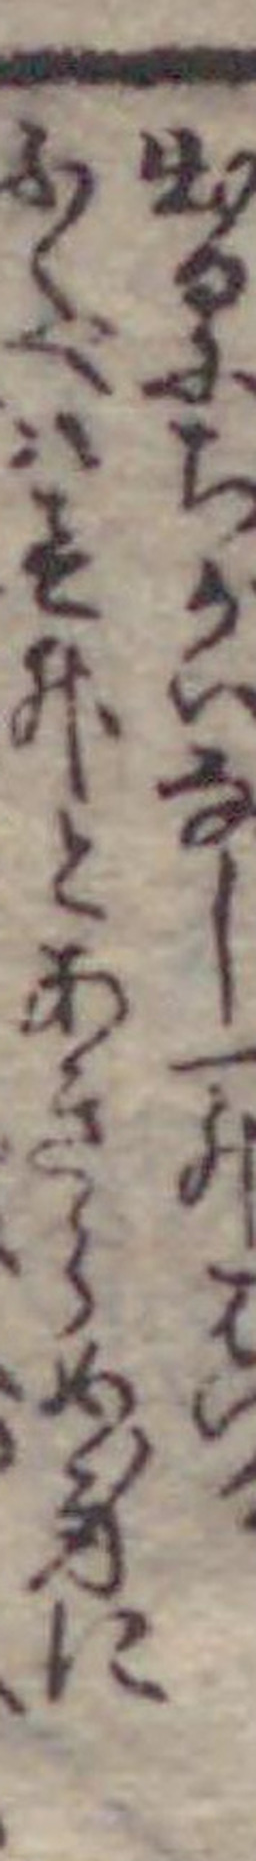ふくべは壱升とあきらめ身に
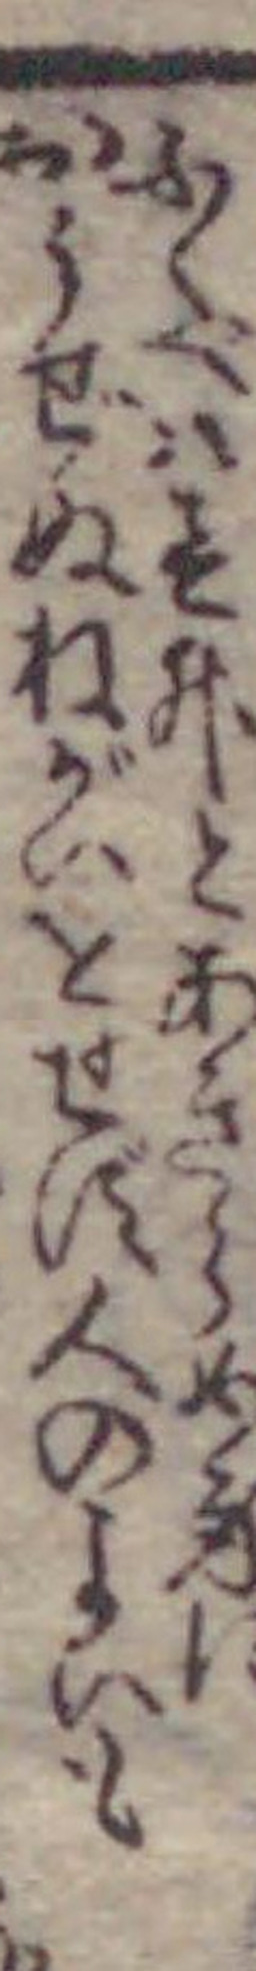おうぜぬねがいをせず人のよいも
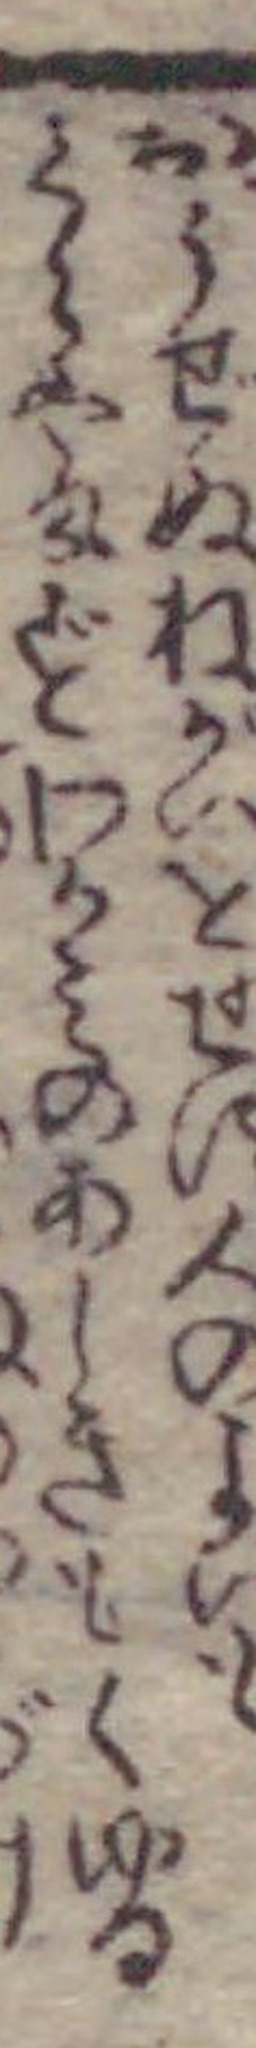うらやまずわかみのあしきもくゆる
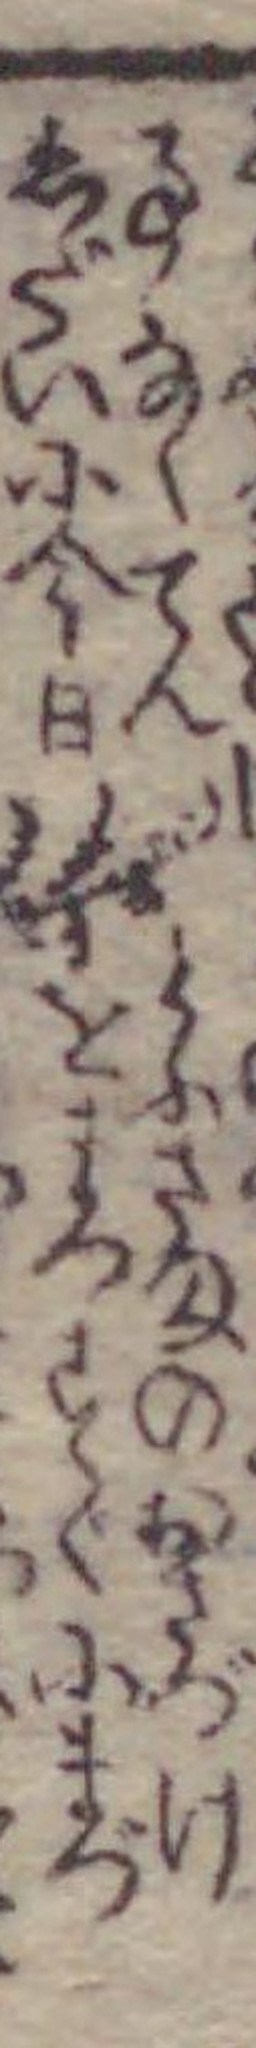しだいに今日をまつすぐにまづ
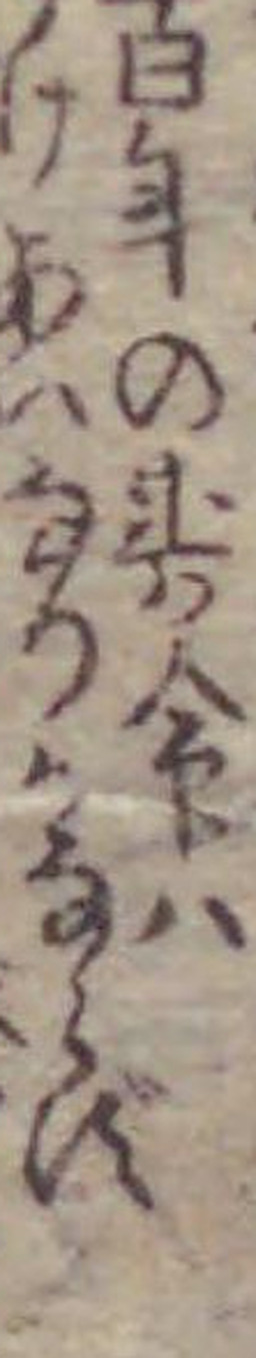うけあいなりかならず
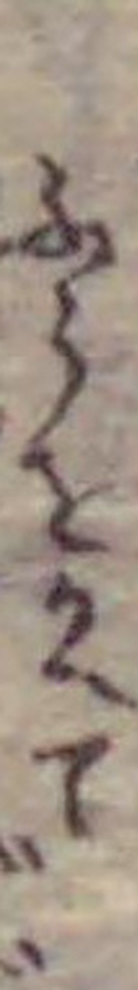ふうをかへて
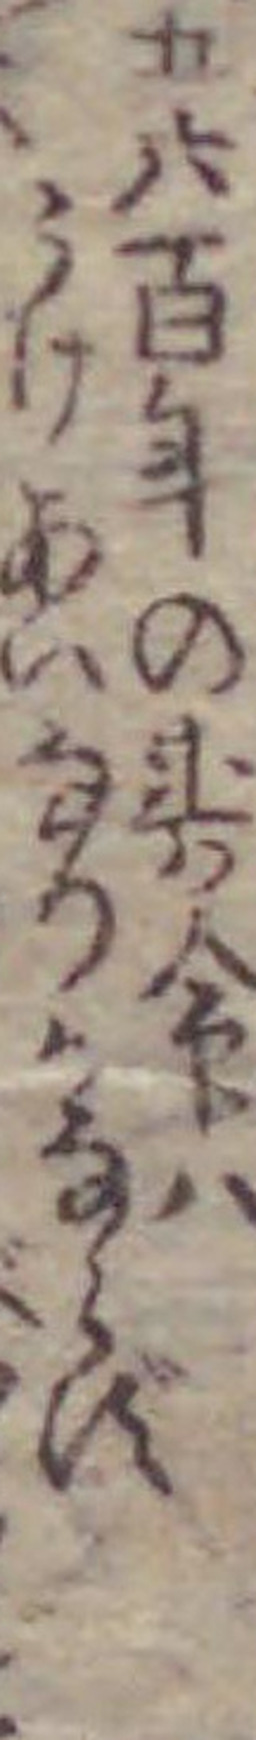うけあいなりかならず
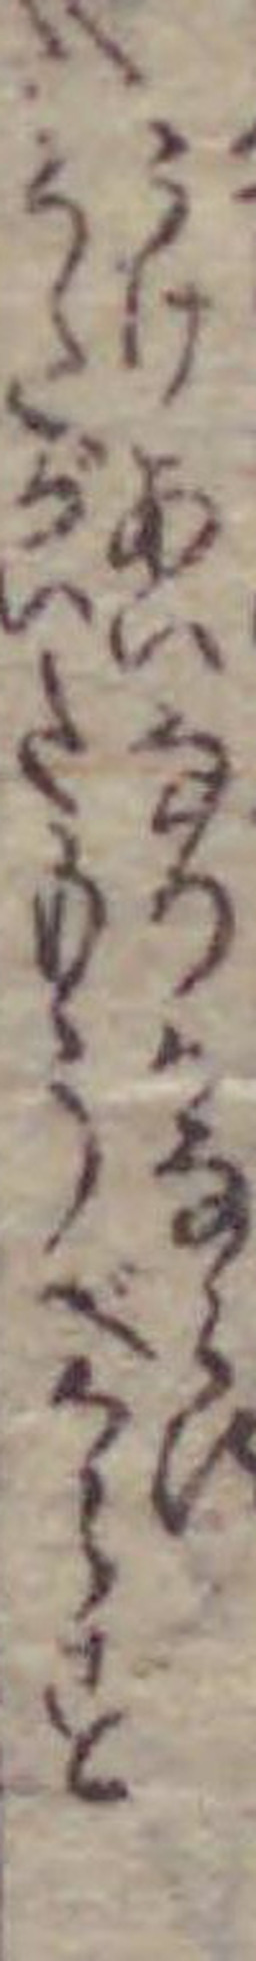うたがいたもうべからす
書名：鼻下長生薬 : 3巻
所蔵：国立国会図書館 National Diet Library, JAPAN
